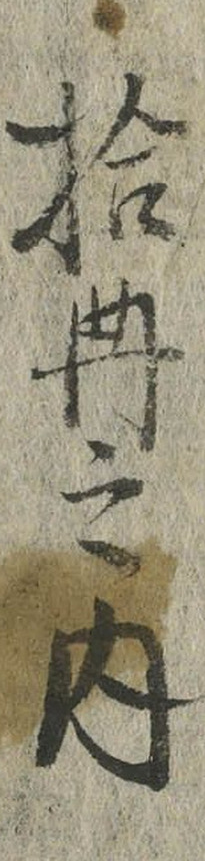拾冊之内
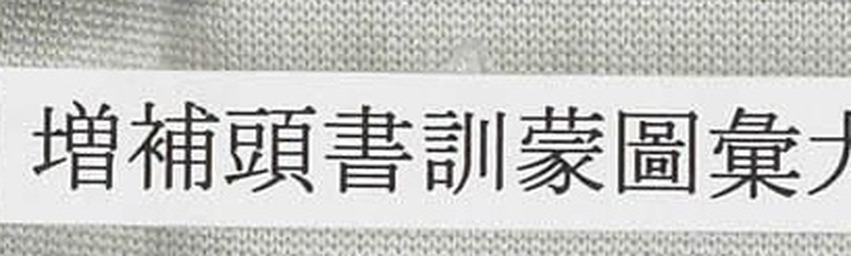増補訓蒙図彙序
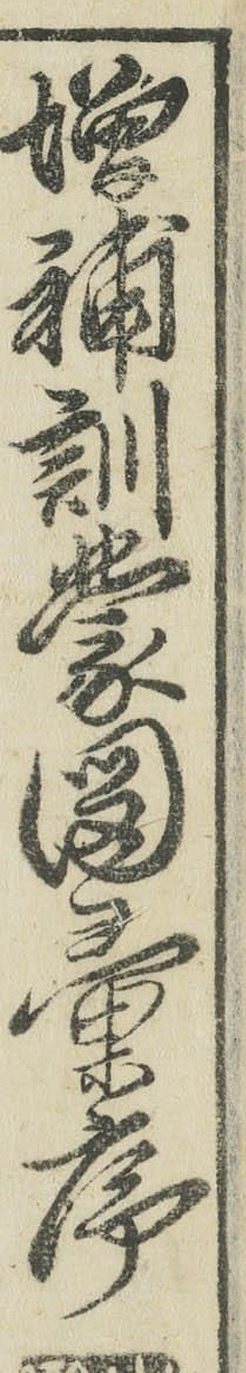増補訓蒙図彙序

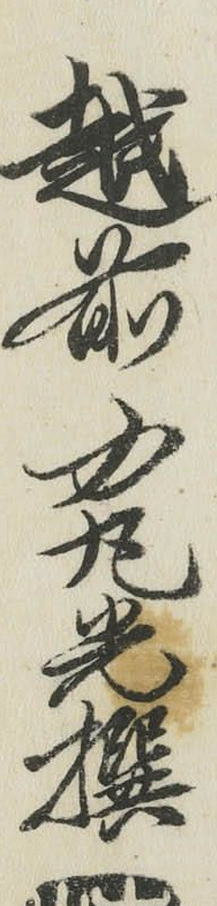越前力丸光撰
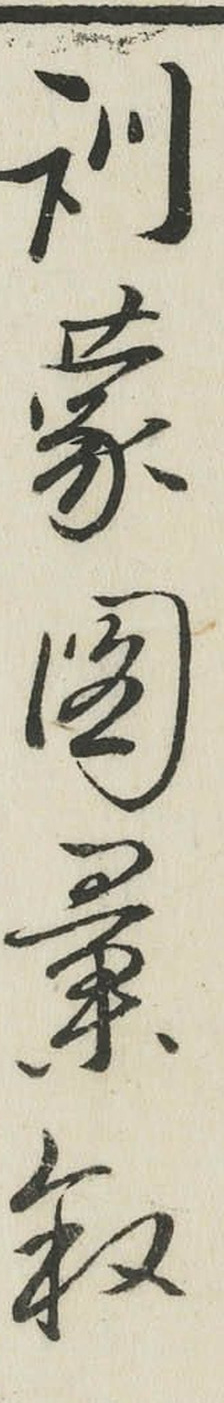訓蒙図彙叙

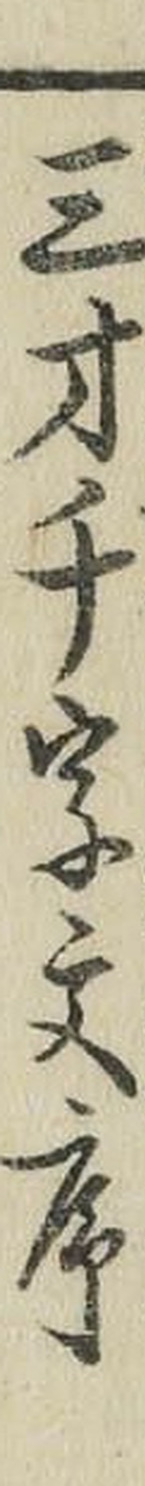三才千字文序
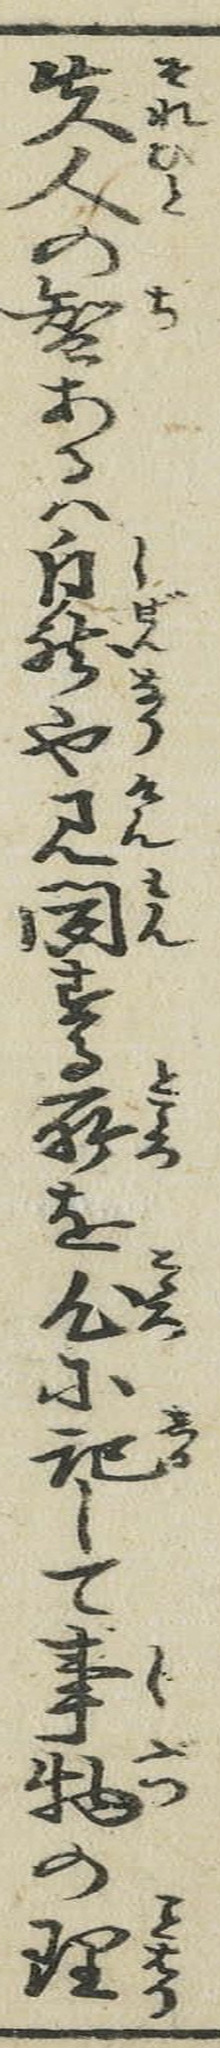先人の智あるは自然也見聞する所を心に記して事物の理
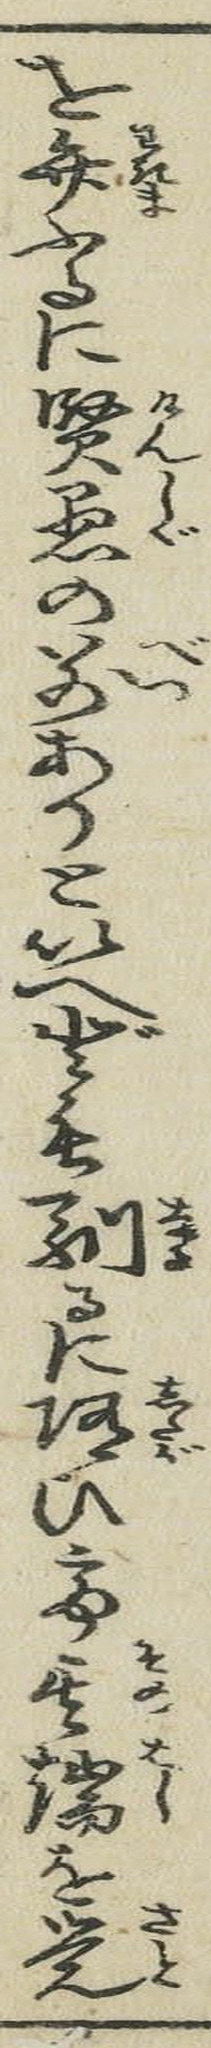を弁ふるに賢愚の別ありといへども馴るに随ひて其端を覚
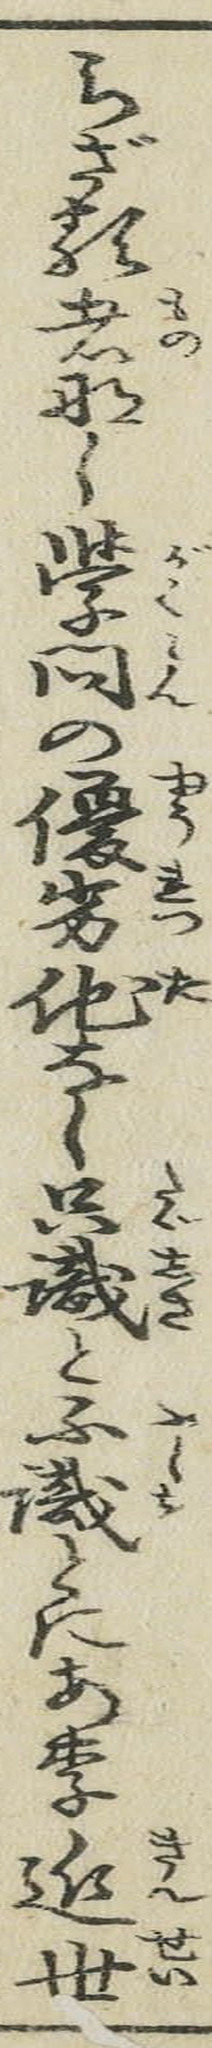らざる者なし学問の優劣他なし只識と不識とにあり近世
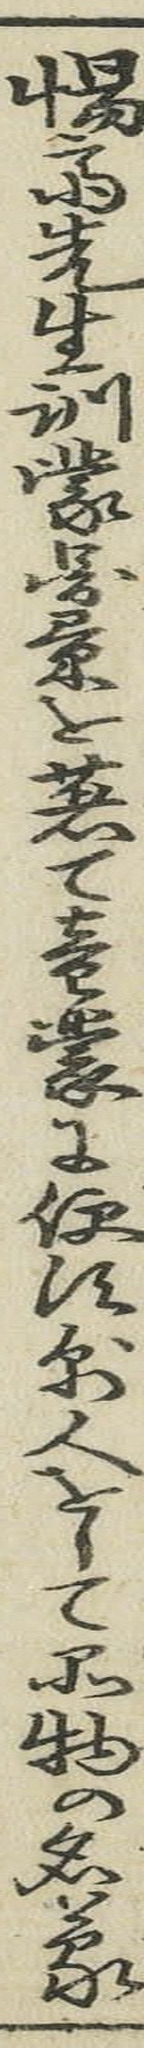惕斎先生訓蒙図彙を著て童蒙に便す則人をして品物の名象
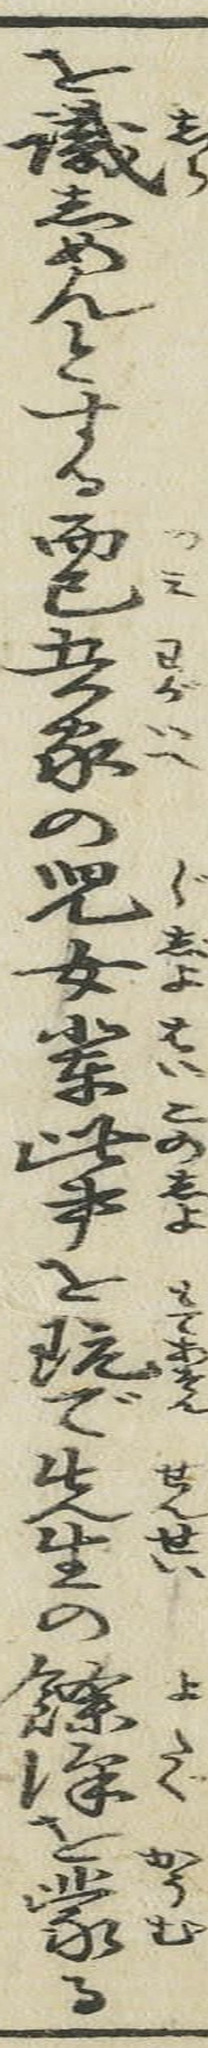を識しめんとする而已吾家の児女輩此書を玩で先生の余沢を蒙る
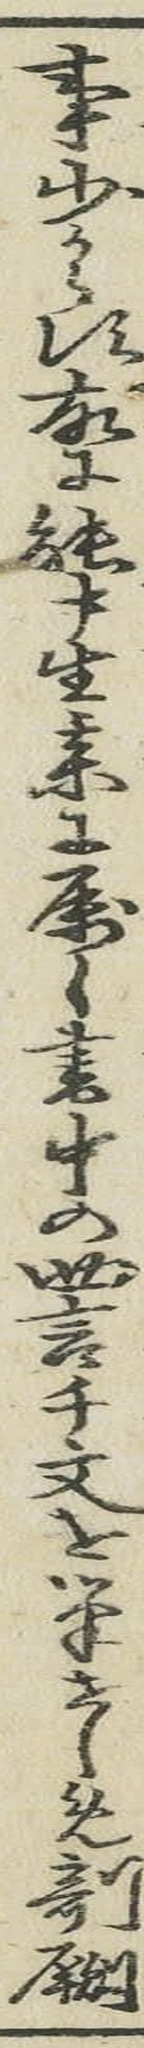事少からす故に能書生某に属し書中の四言千文を筆せしめ剞劂
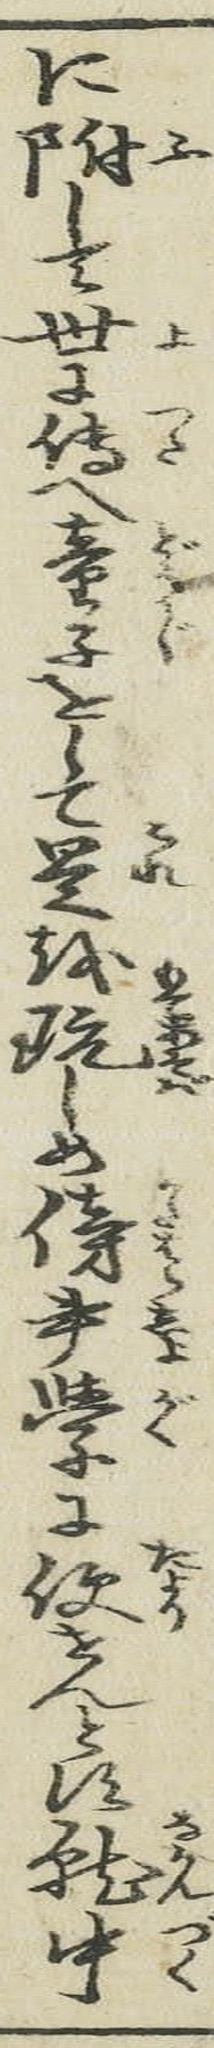に附して世に伝へ童子をして是を玩しめ傍書学に便せんとす就中
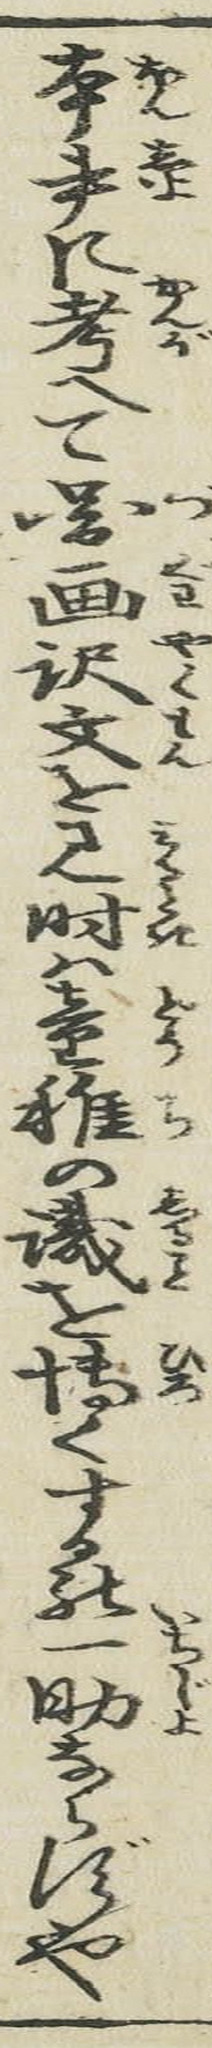本書に考へて図画訳文を見時は童稚の識を博くするの一助ならずや
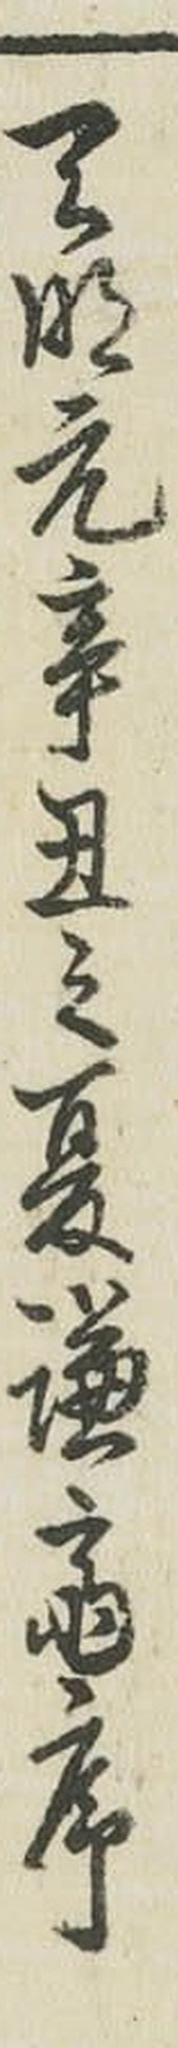天明元辛丑之夏謙斎序
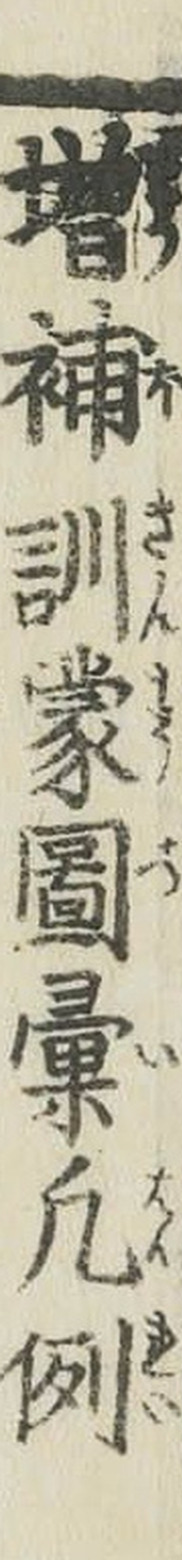増補訓蒙図彙凡例
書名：増補頭書訓蒙図彙大成 10巻 1:序, 凡例, 目録
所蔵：東京学芸大学教育コンテンツアーカイブ
